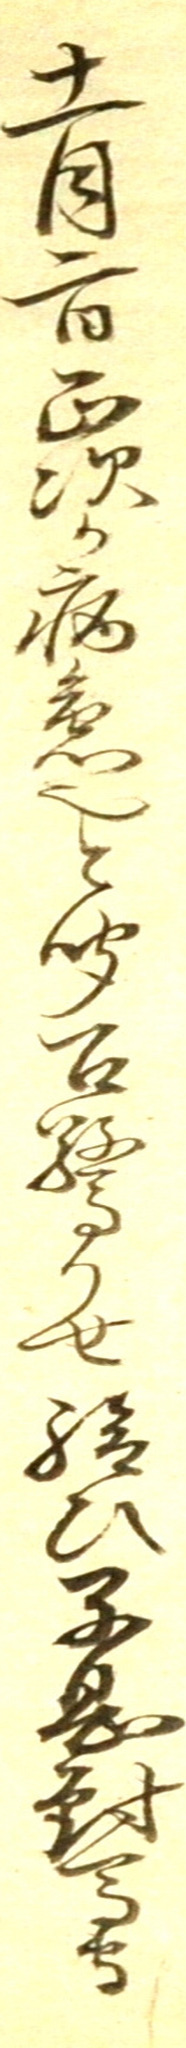十一月二日正次か病急也と聞召驚かせ給ひ子息対馬守
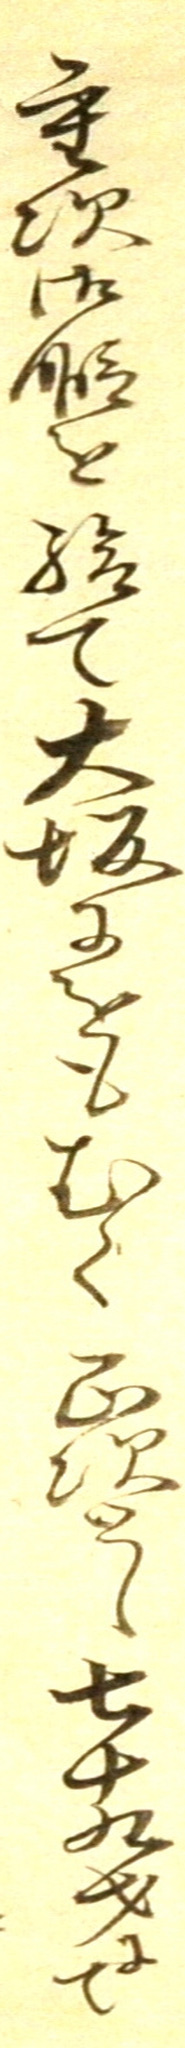重次御暇を給て大坂にをもむく正次とし七十九才にて

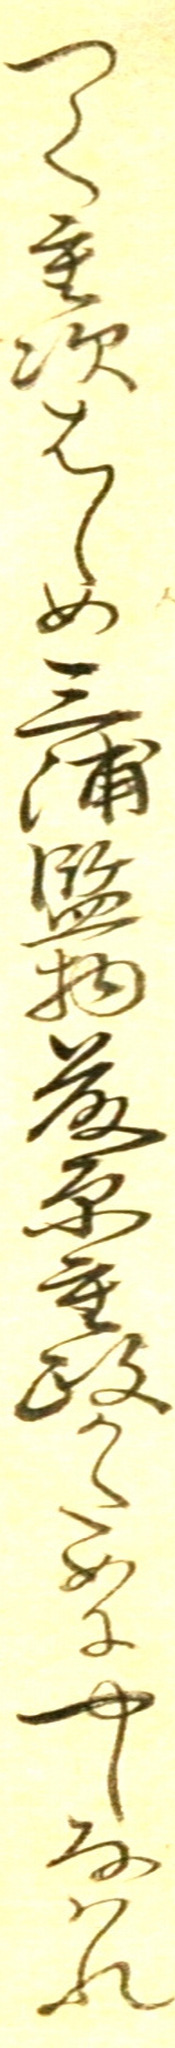つく重次はしめ三浦監物藤原重政かためにやしなはれ

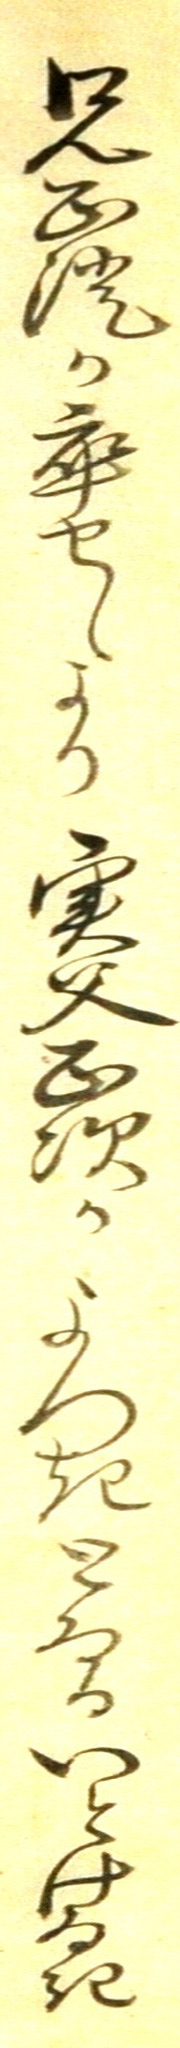兄正澄か卒せしより実父正次かよつきとなるいとけなき
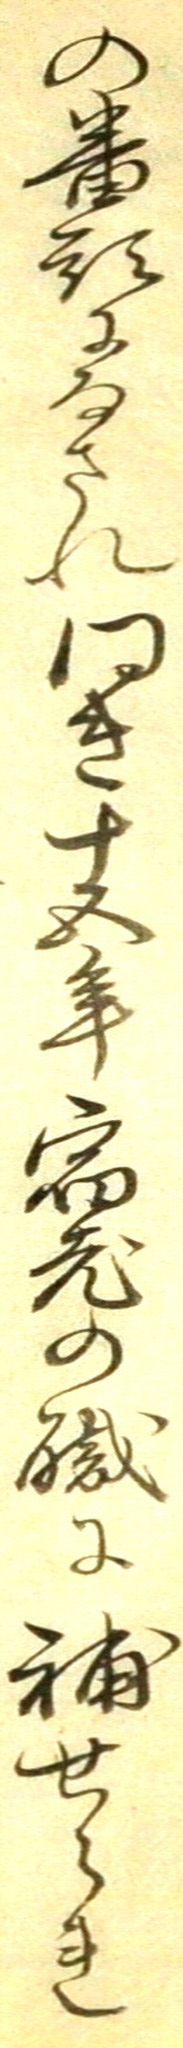の番頭になされ同き十五年宿老の職に補せられ
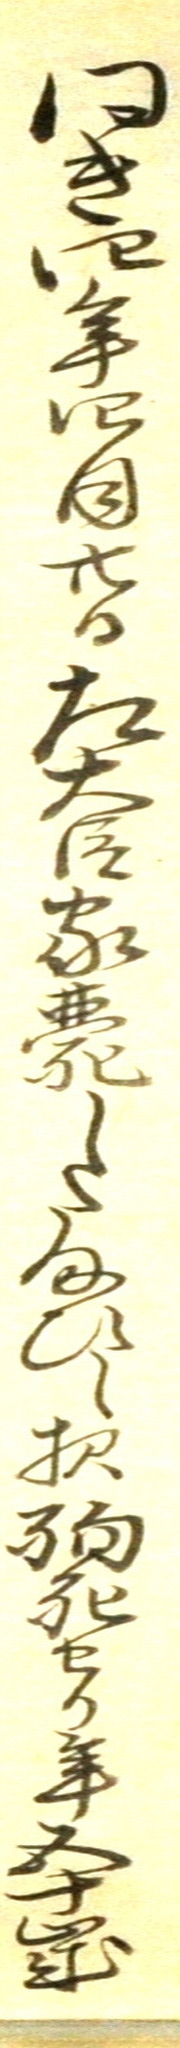同き四年四月廿日左大臣家薨したまひし夜殉死せり年五十歳

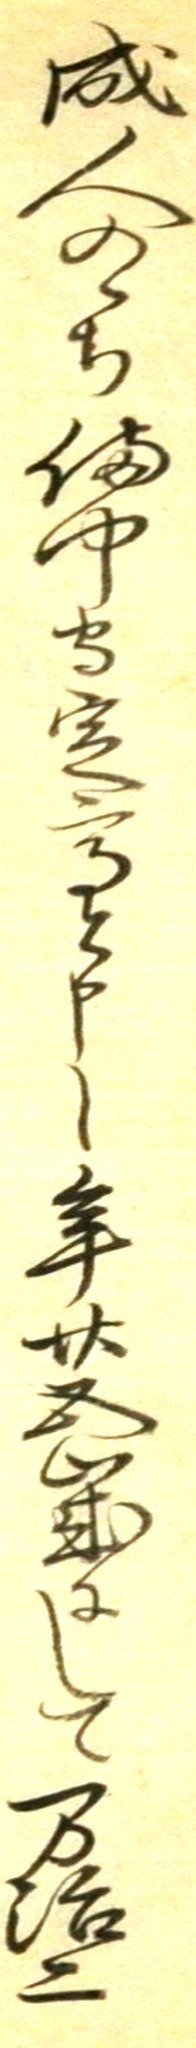成人のゝち備中守定高と申し年廿五歳にして万治二
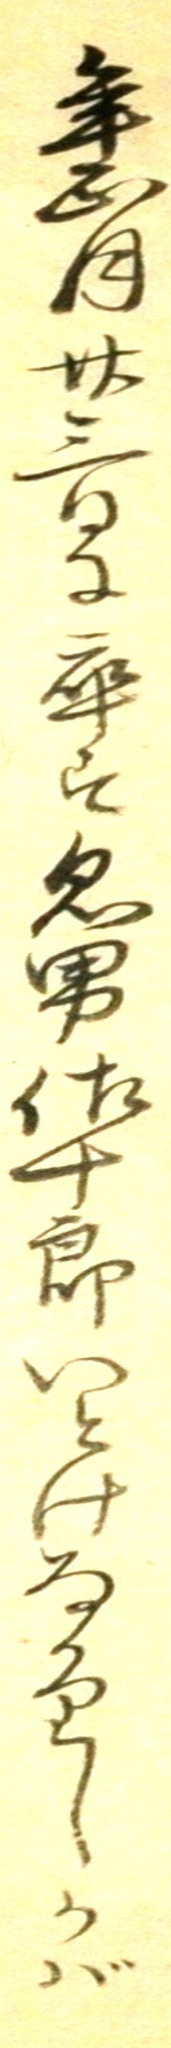年正月廿三日に卒す息男作十郎いとけなかりしかば
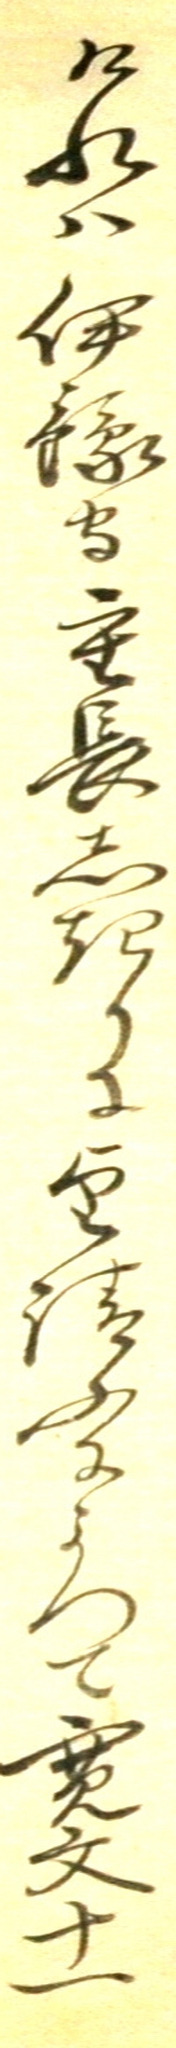けれは伊予守重長しきりに望請ふによつて寛文十一
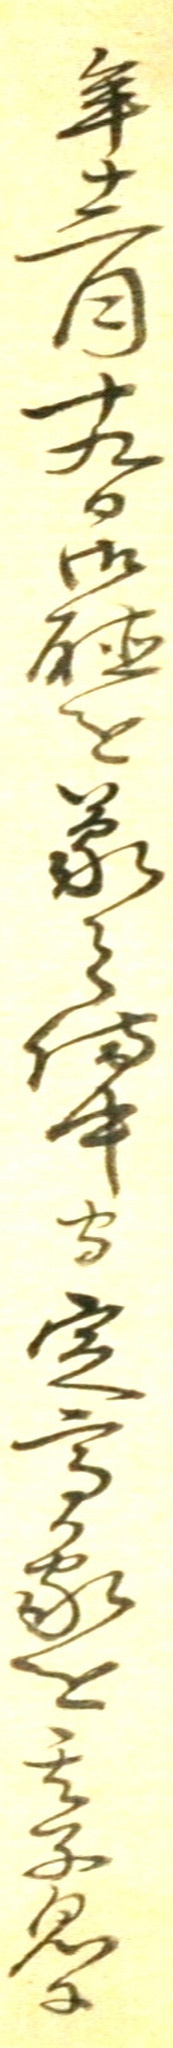年十二月十九日御殖を蒙て備中守定高か家を其子息に
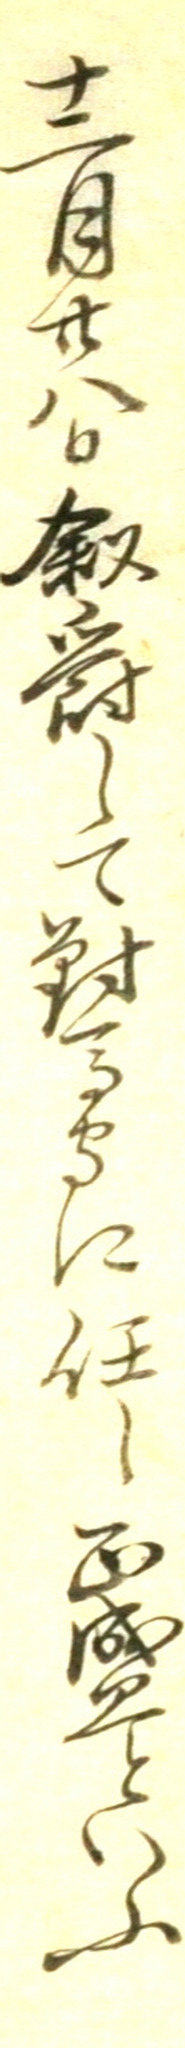十二月廿八日叙爵して対馬守に任し正盛といふ
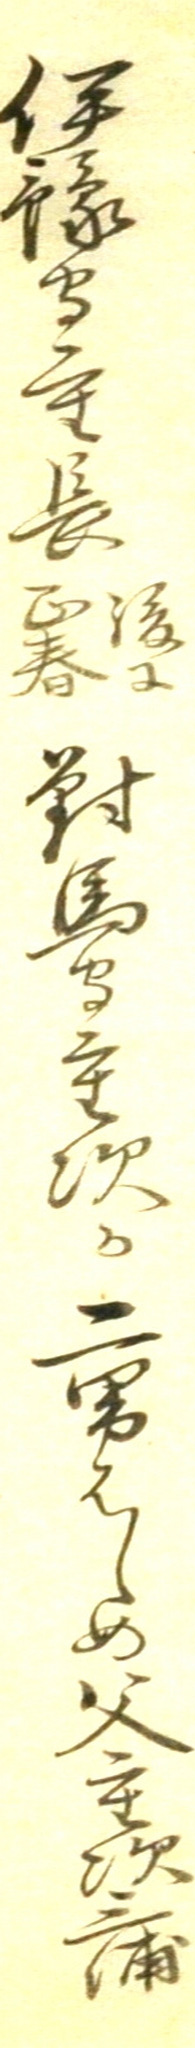伊予守重長後に正春対馬守重次か二男はしめ父重次三浦
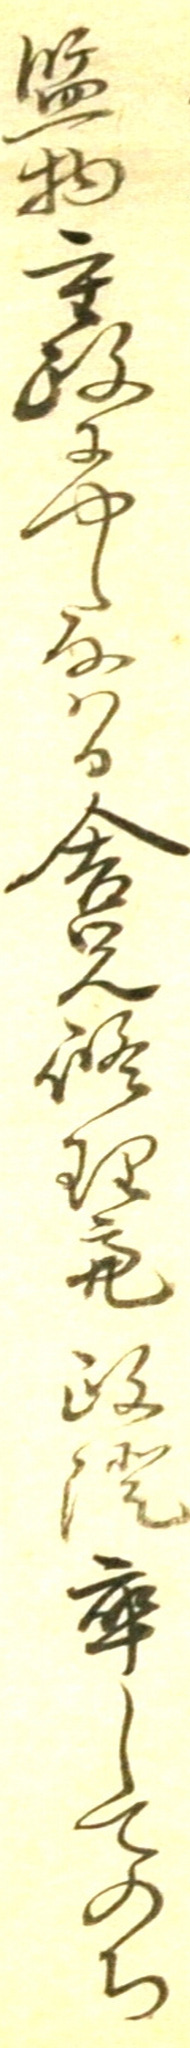監物重政にやしなはる舎兄修理亮政澄卒してのち
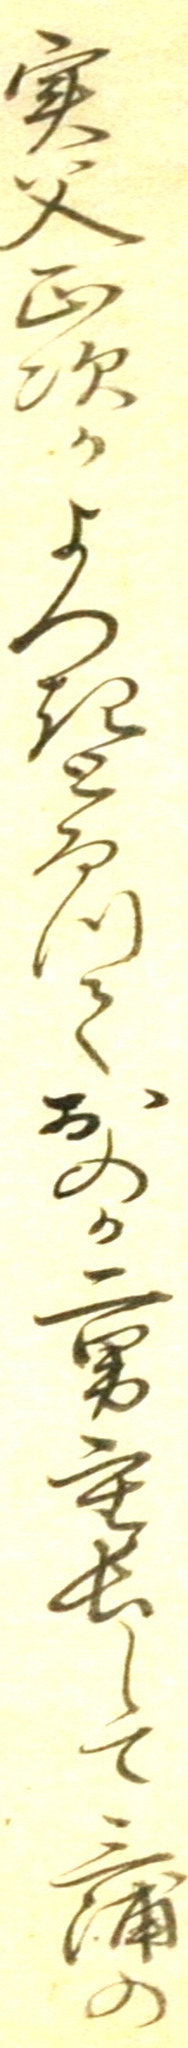実父正次かよつきとなつておのか二男重長して三浦の
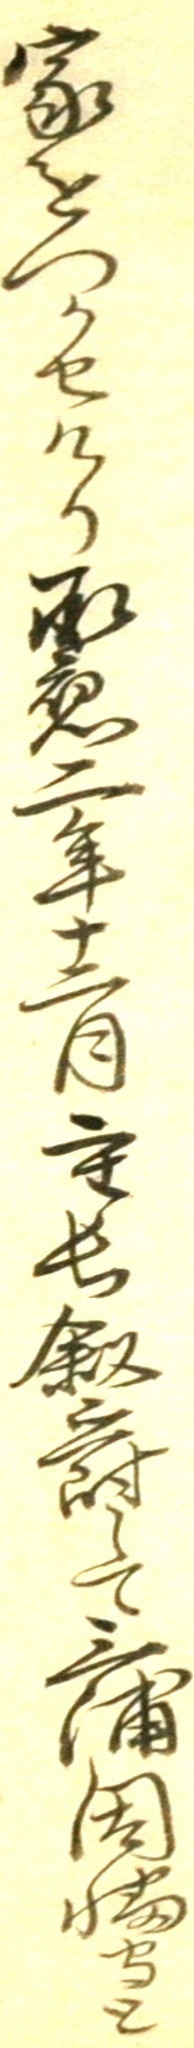家をつかせけり承応二年十二月重長叙爵して三浦因幡守と
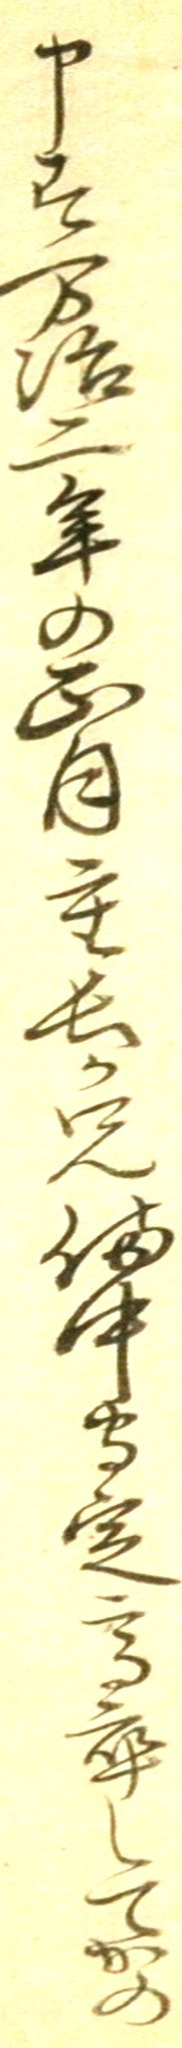申す万治二年の正月重長か兄備中守定高卒してかの
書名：藩翰譜（五）
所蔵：伊那市立高遠町図書館・合同会社AMANE
